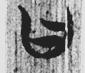曰
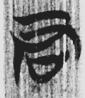君
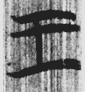王
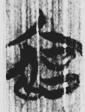○（窮）
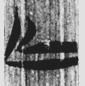亡
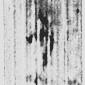人
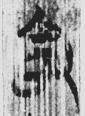命
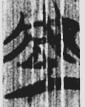○（吾）
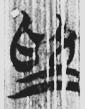爲
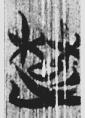楚
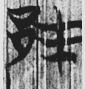邦
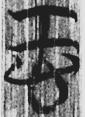○（恐）
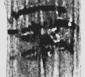不
